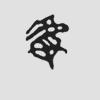虘B
